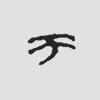于
